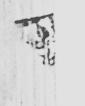四十=
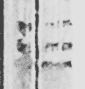三
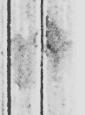千
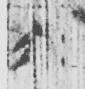六
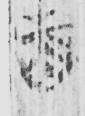百
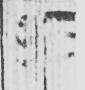三
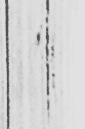千
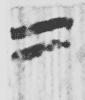二
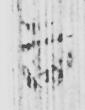百
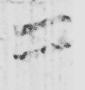二
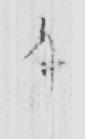千
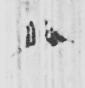八
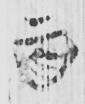百
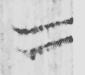二
